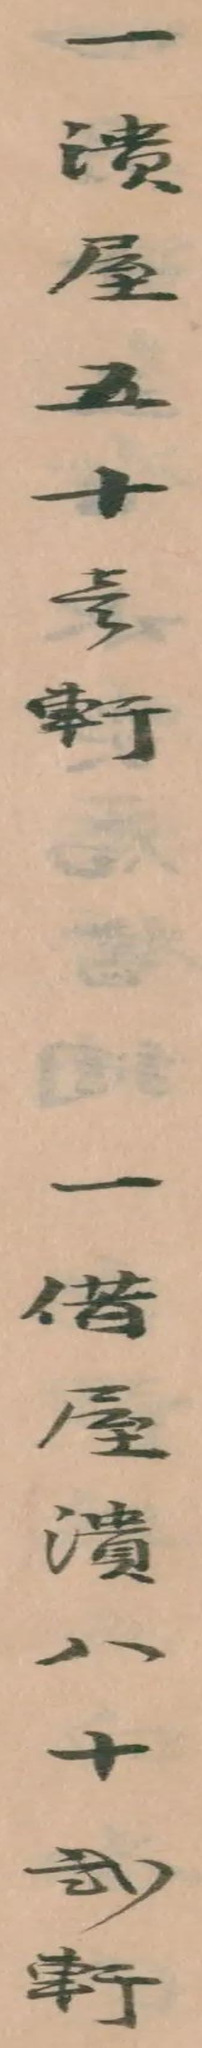一潰屋五十壱軒一借家潰八十弐軒
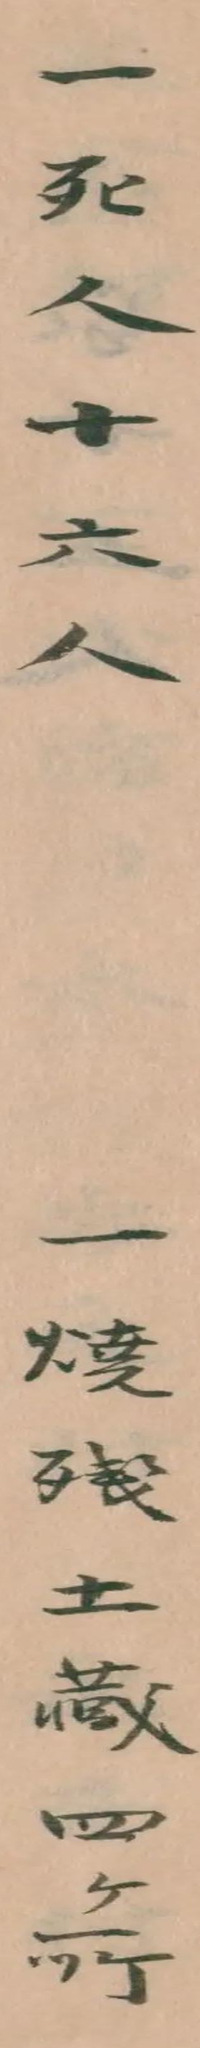死人十六人一焼残土藏四ヶ所
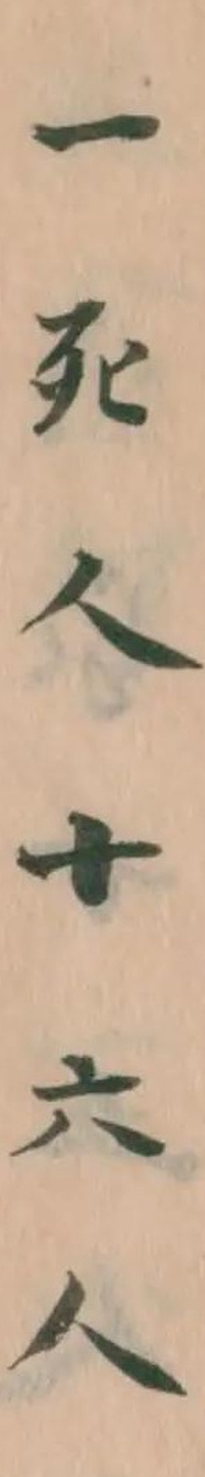一死人六人
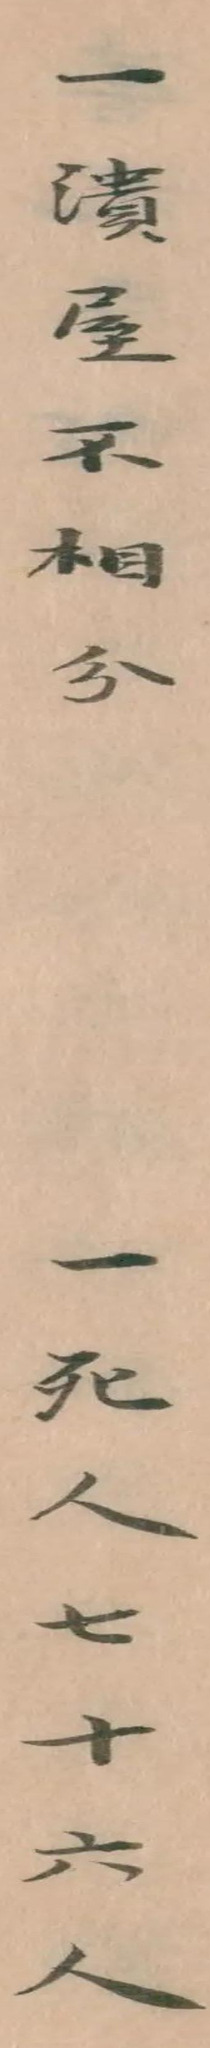一潰屋不相分一死人七十六人
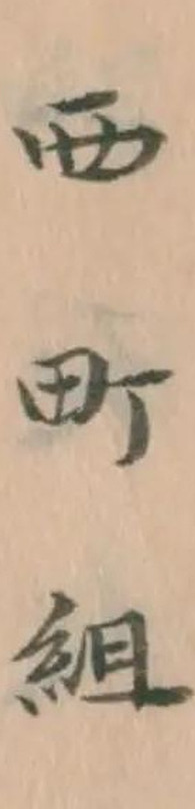西町組
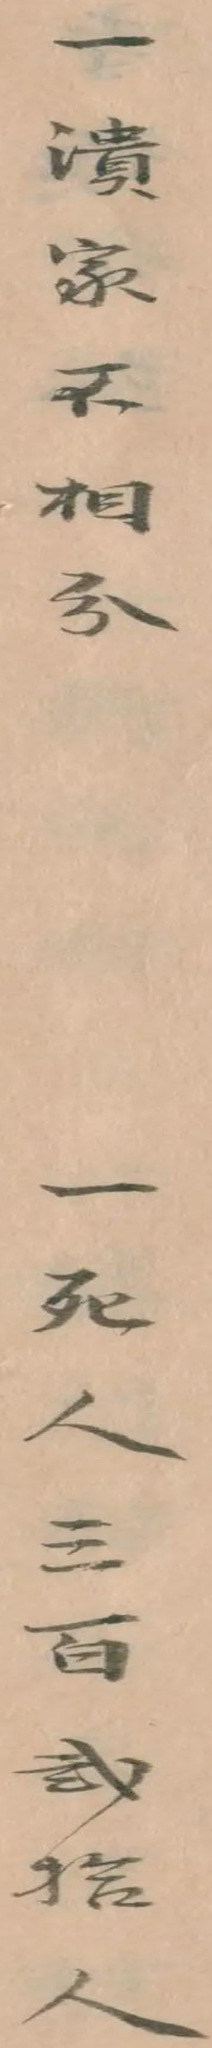一潰家不相分一死人三百弐拾人

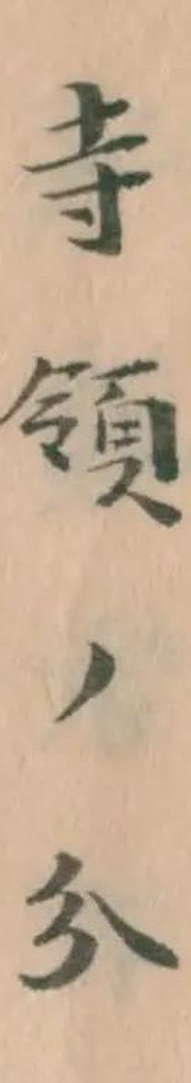寺領ノ分
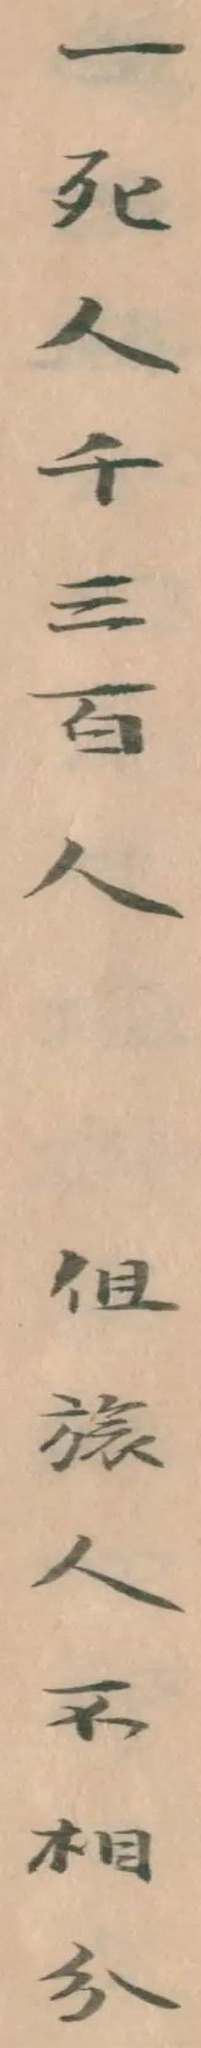一死人千三百人但旅人不相分
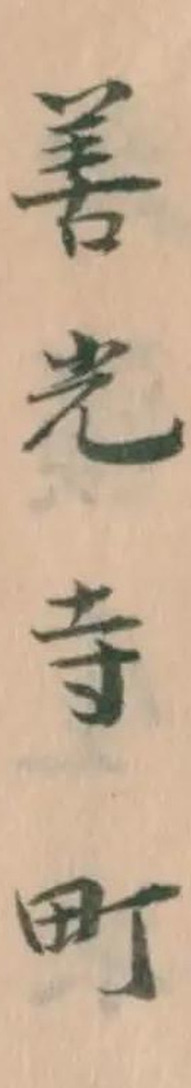善光寺町
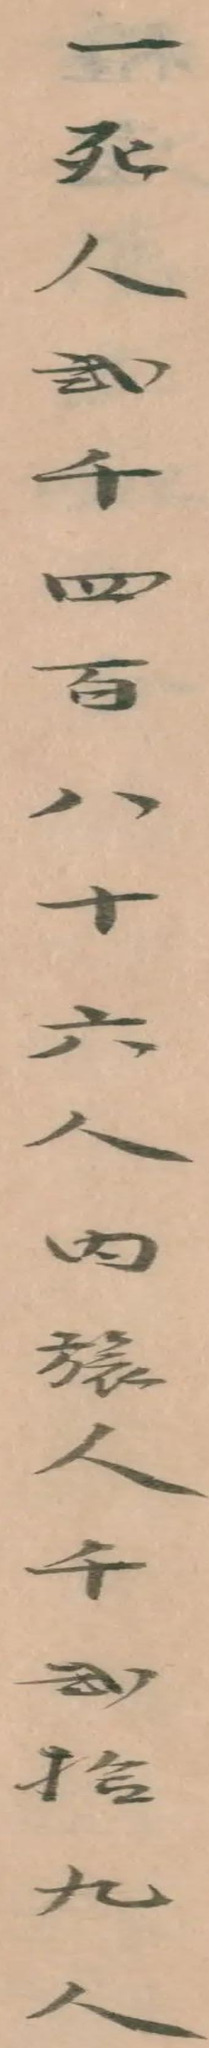一死人弐千四百八十六人内旅人千弐拾九人
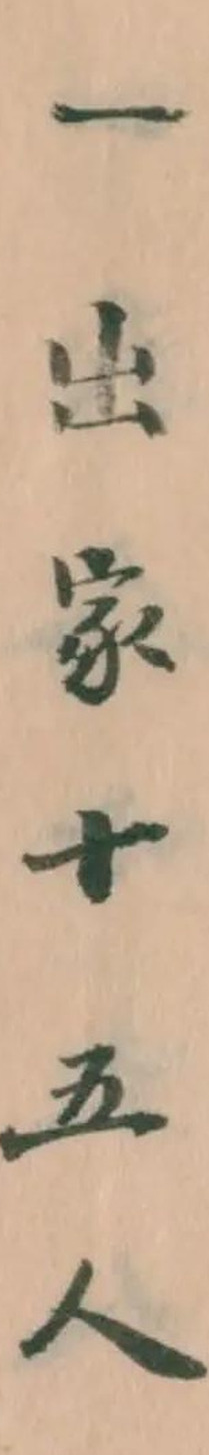一出家十五人
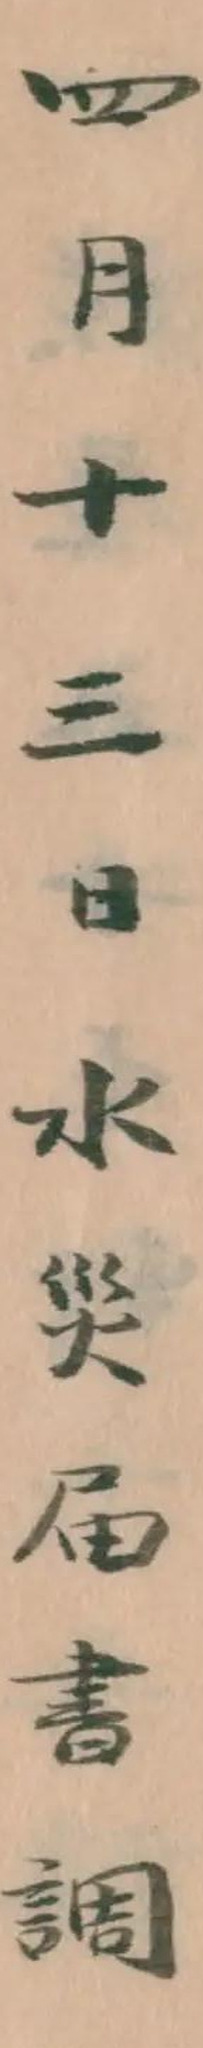四月十三日水災届書調
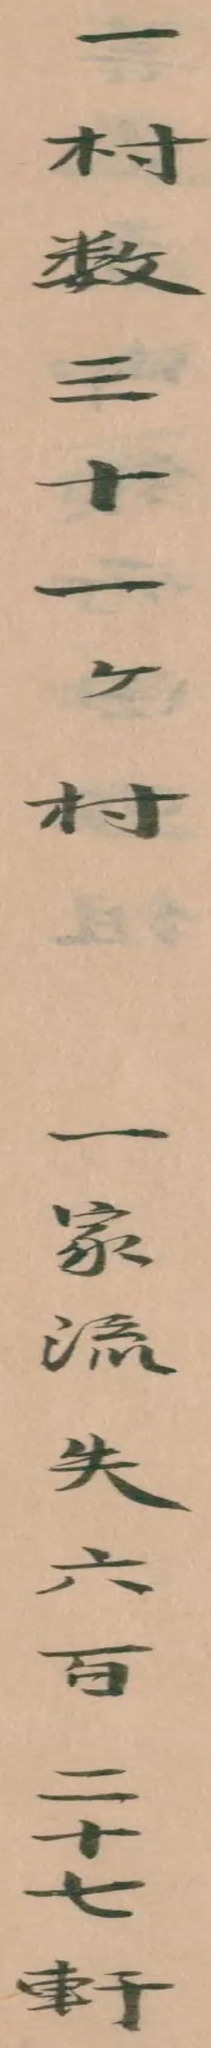一村数三十一ケ村一家流失六百二十七軒
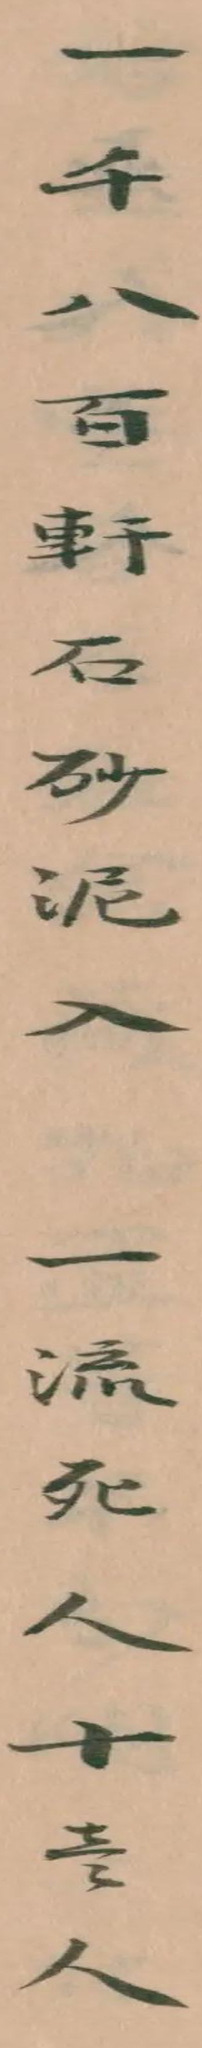一千八百軒石砂泥入一流死人十壱人
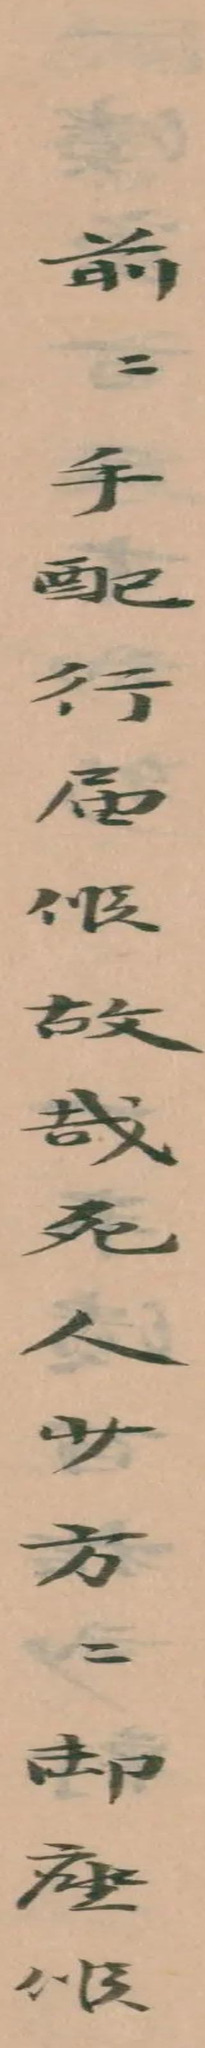前ニ手配行届候故哉死人少方ニ御座候
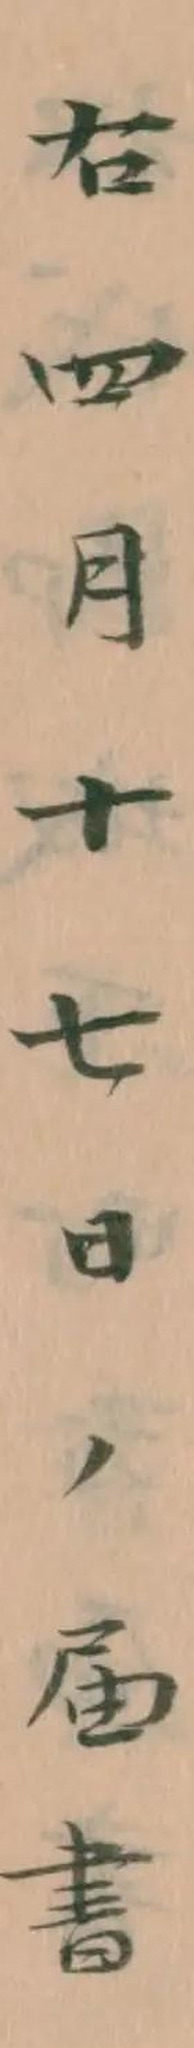右四月十七日ノ届書
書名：地災撮要. 巻5-6(地震之部)
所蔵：国立国会図書館 National Diet Library, JAPAN
